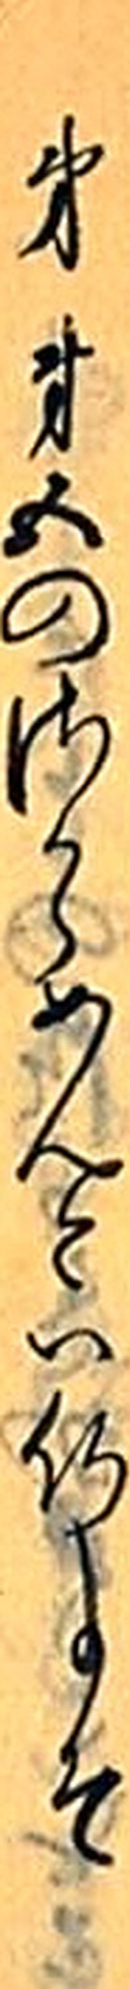弟第五のさからめんとは何事そ
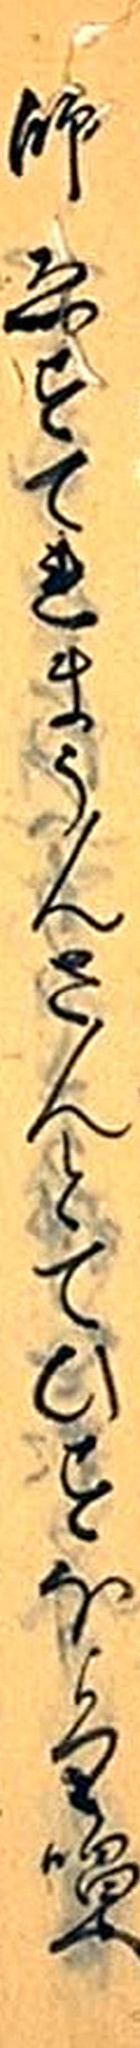師ゑすてれまうんさんとてひすほより唱へ
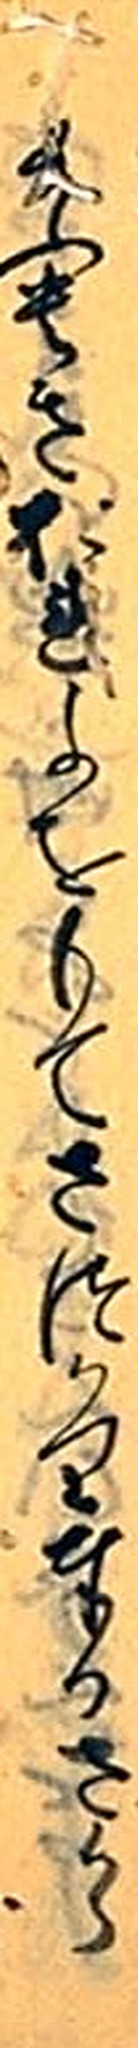給ふ貴きおれよをもてさつかり奉るさから
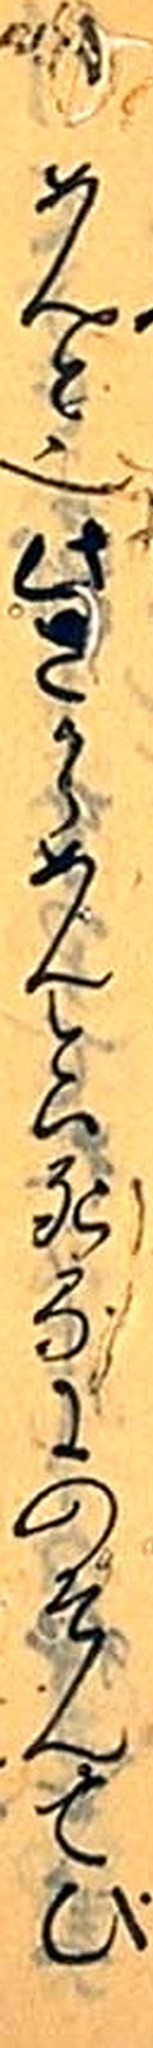めんと也此さからめんとは死るにのそんてび
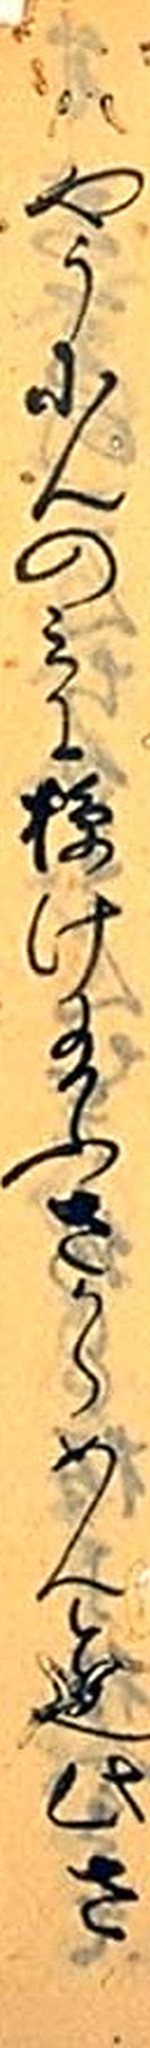やうにんのみに授け給ふさからめんと也此さ
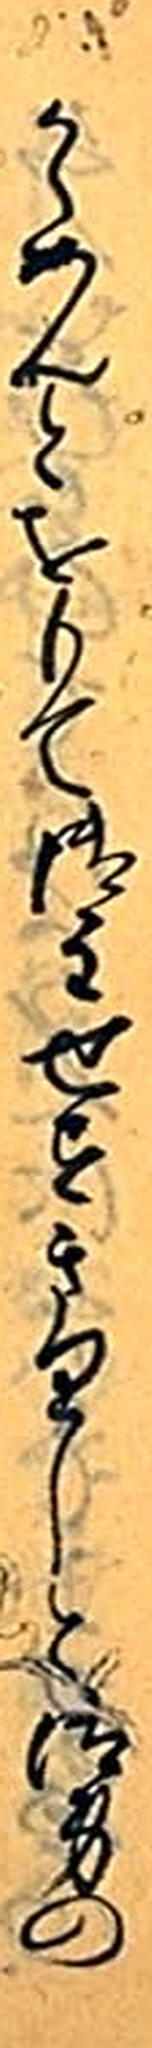からめんとをもて御主せすきりしと御身の
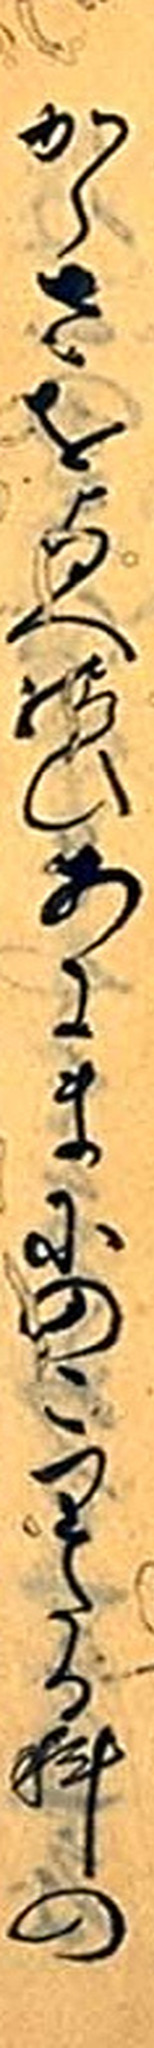からさを与へ給ひあにまにのこりたる科の
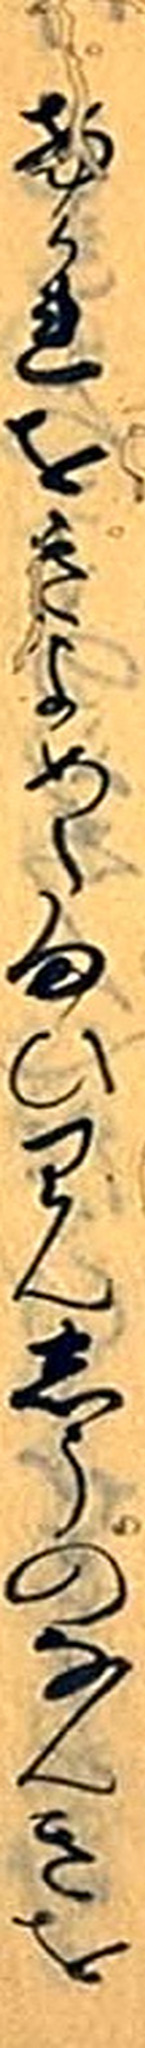けかれをきよめたまひりんしうのなんきを
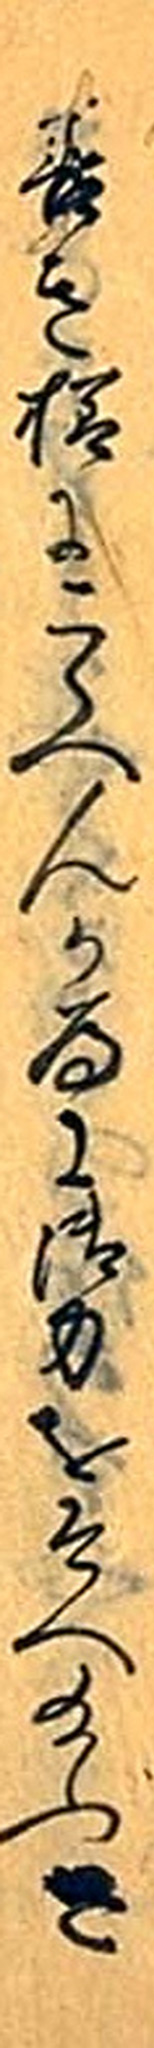善き様にこらへんか為に御力をそへ給ふさ
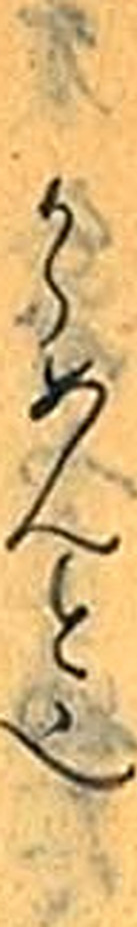からめんと也
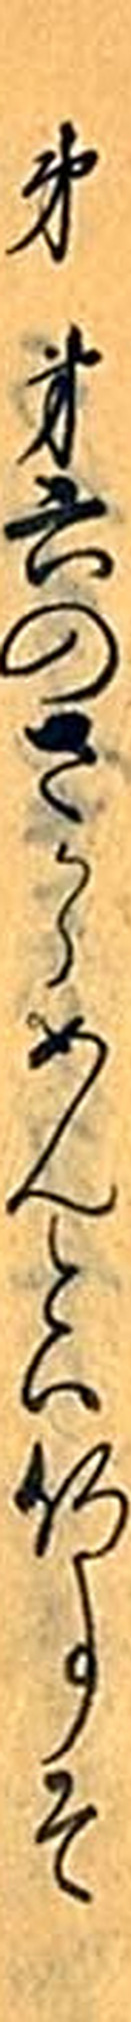弟第六のさからめんとは何事そ
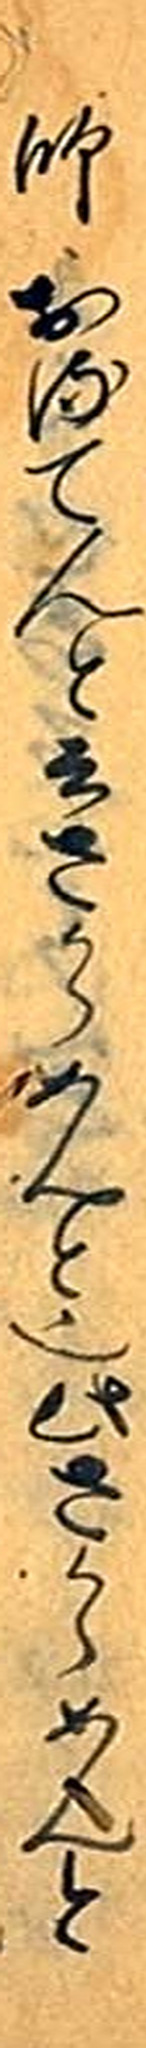師おるてんと云さからめんと也此さからめんと
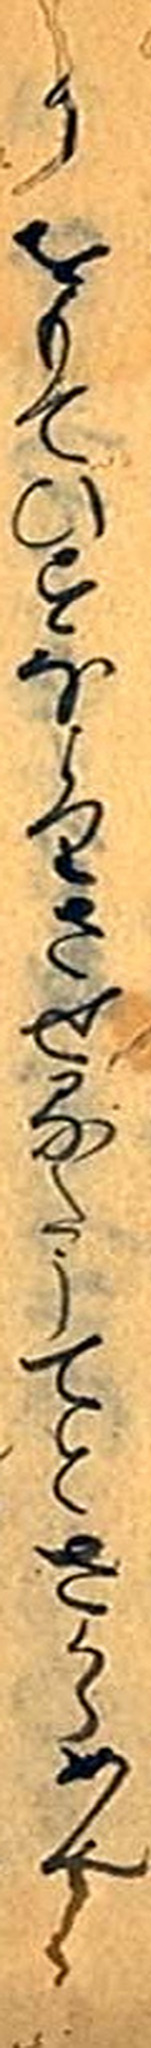をもてひすほよりさせるたうてとさからめん
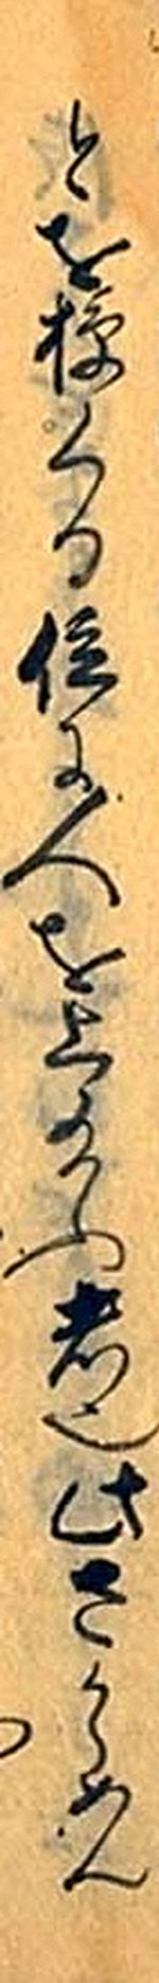とを授くる位に人を上給ふ者也此さからめん
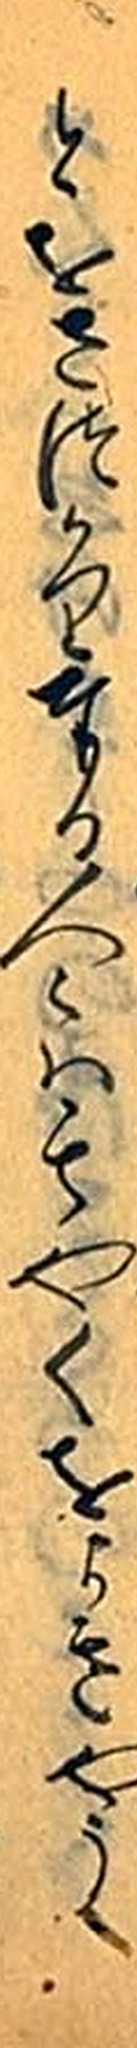とをさつかり奉る人々は其やくをよきやう
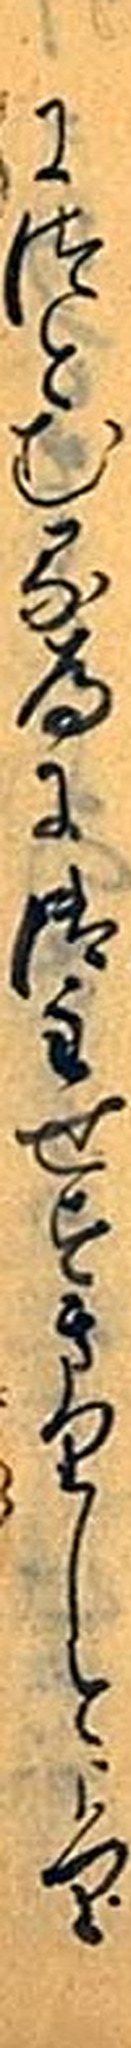につとむる為に御主せすきりしとより
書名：ドチリナ・キリシタン
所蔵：東京大学総合図書館 / General Library in the University of Tokyo
